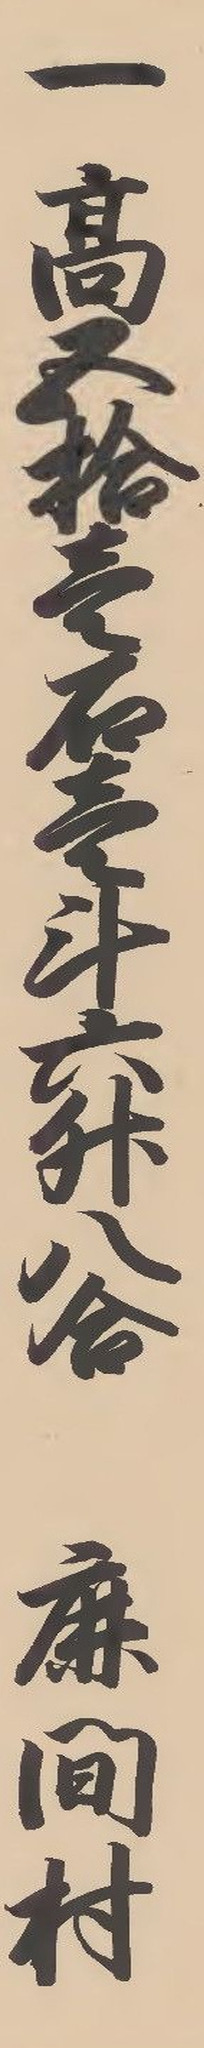一高五拾壱石壱斗六升八合鹿間村
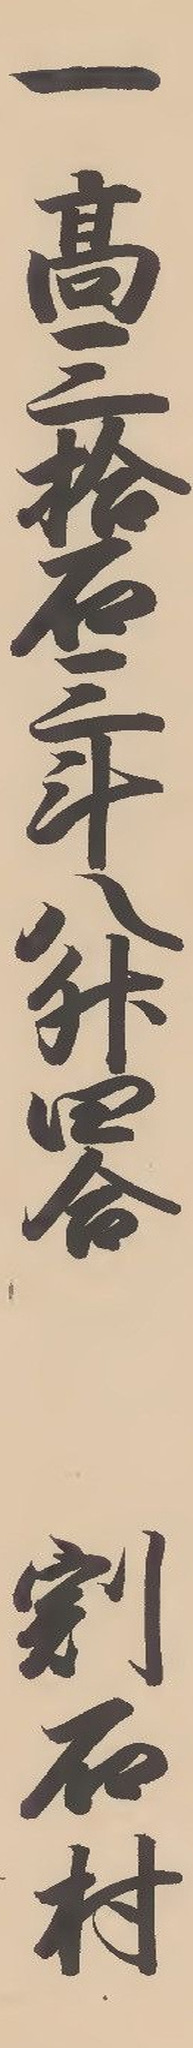一高三拾石三斗八升四合割石村
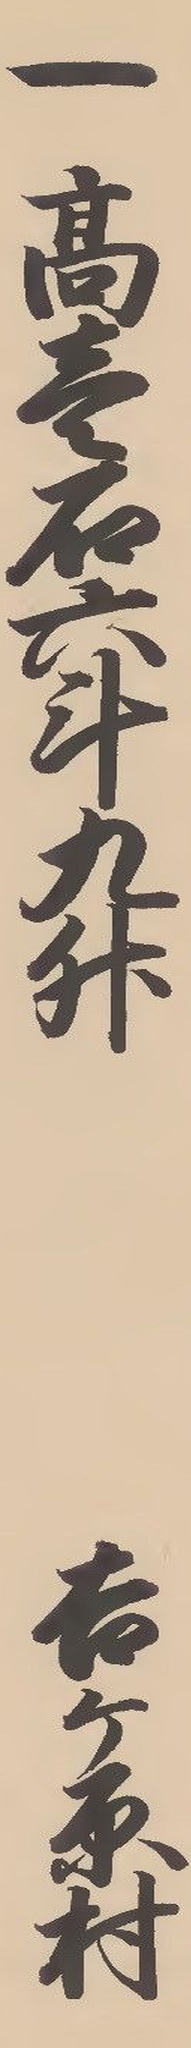一高壱石六斗九升吉ヶ原村
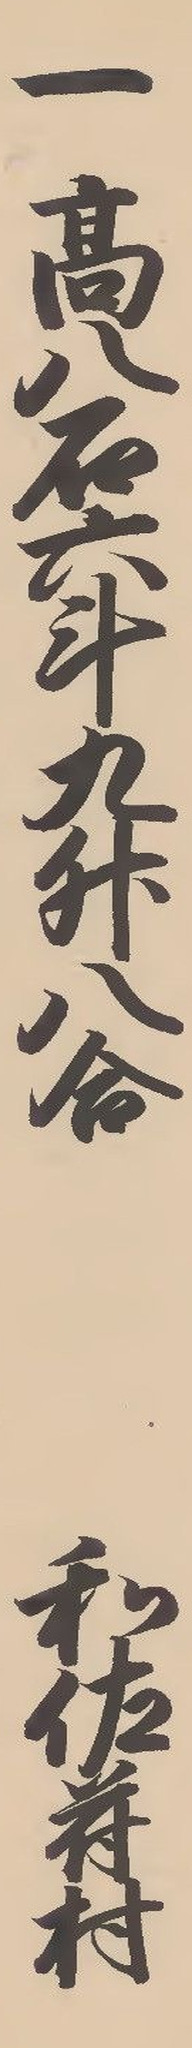一高八石六斗九升八合和佐符村
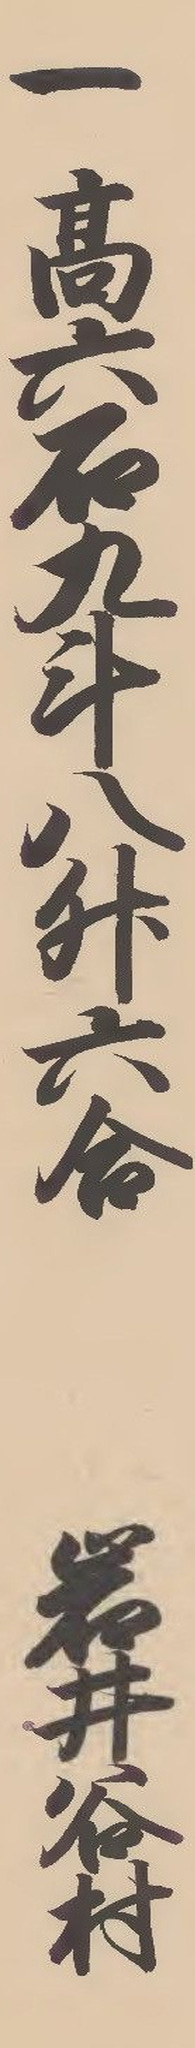一高六石九斗八升六合岩井谷村

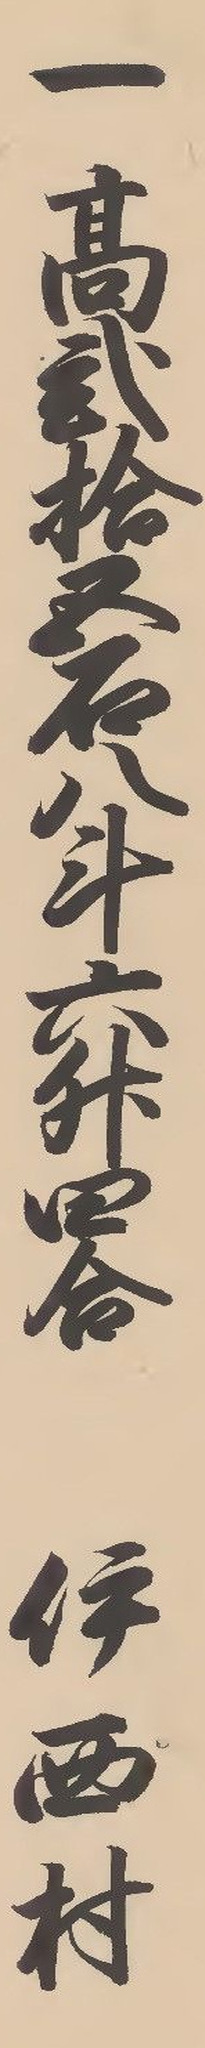一高弐拾五石八斗六升四合伊西村
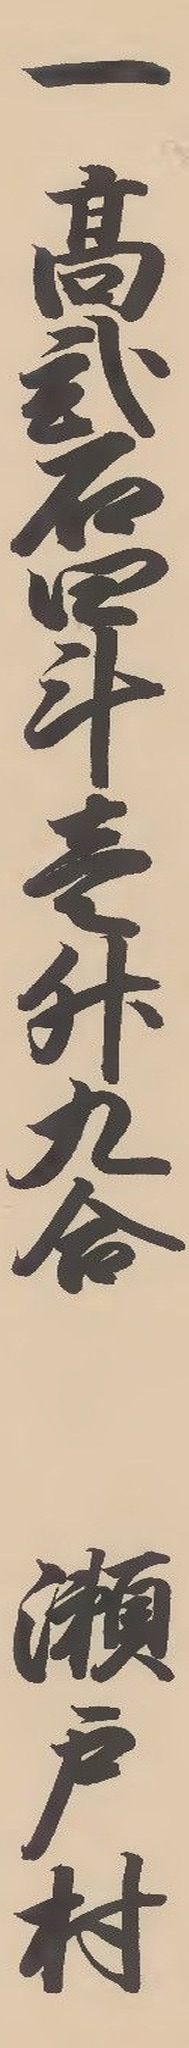一高弐石四斗壱升九合瀬戸村
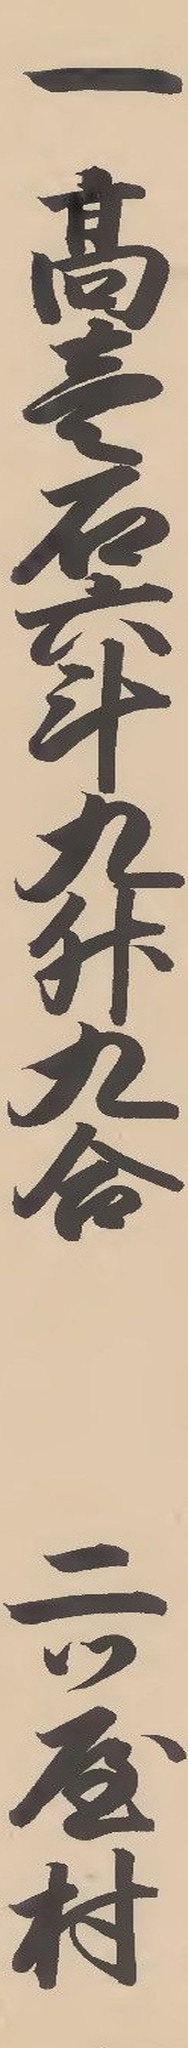一高壱石六斗九升九合二ツ屋村
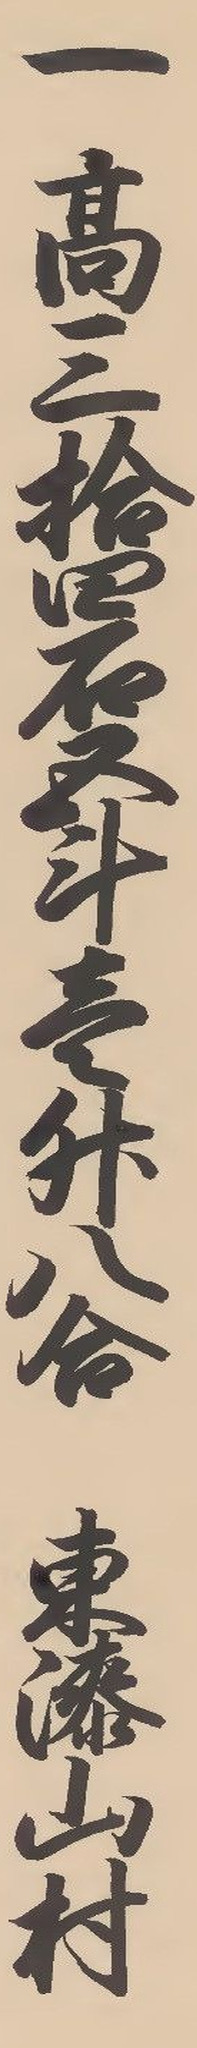一高三拾四石五斗壱升八合東漆山村
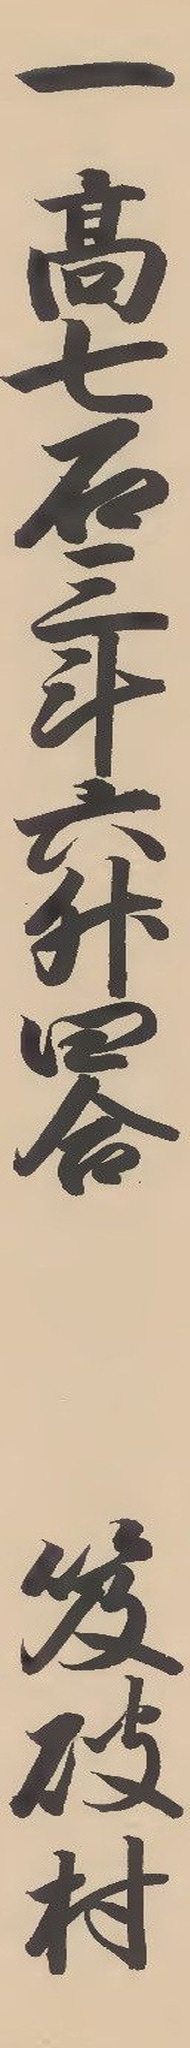一高七石三斗六升四合笈破村
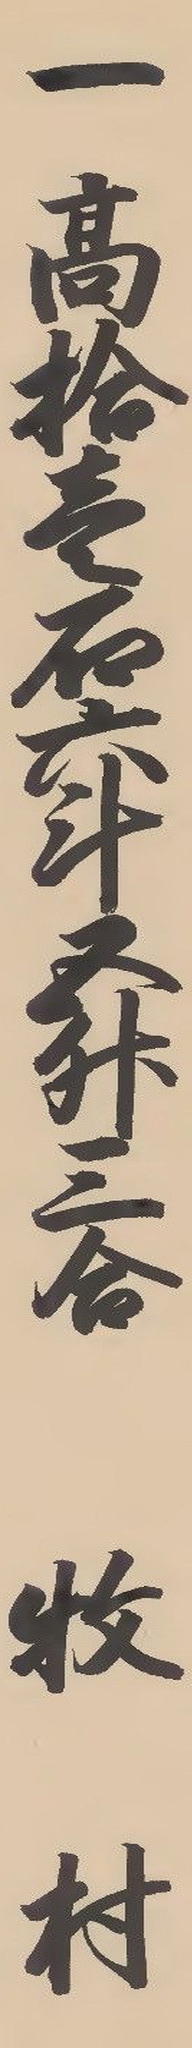一高拾壱石六斗五升三合牧村
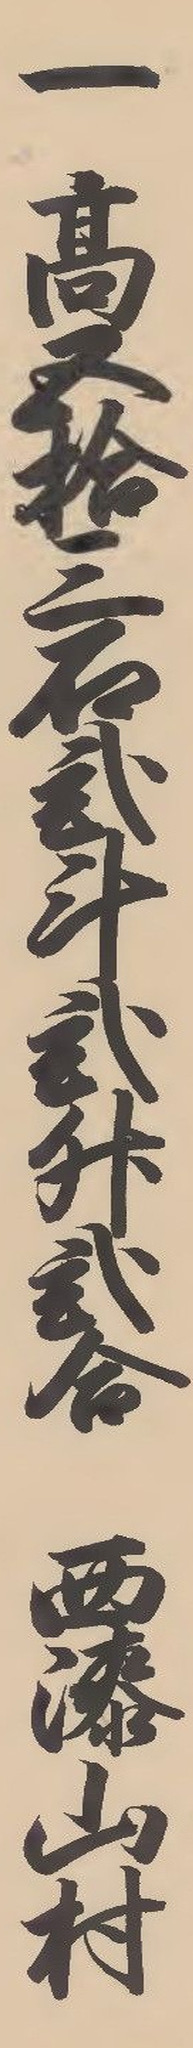一高五拾三石弐斗弐升弐合西漆山村

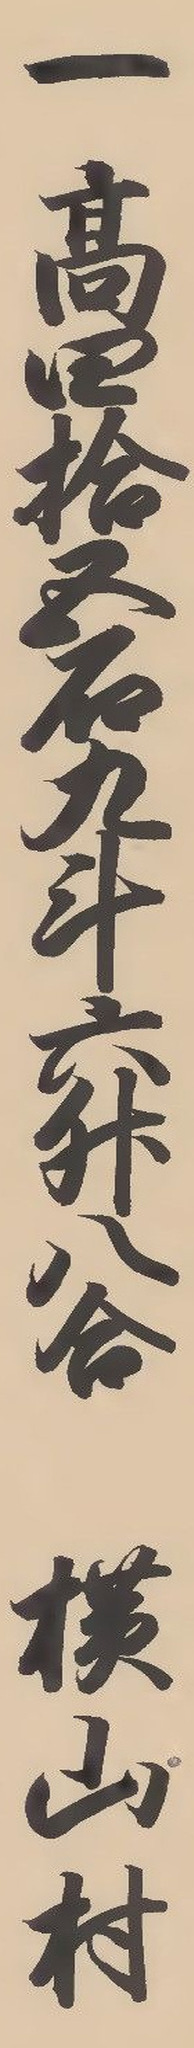一高四拾五石九斗六升八合横山村
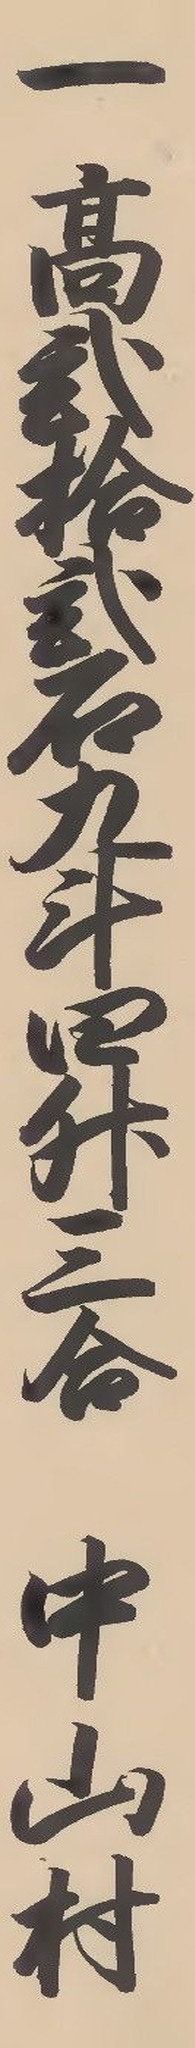一高弐拾弐石九斗四升三合中山村
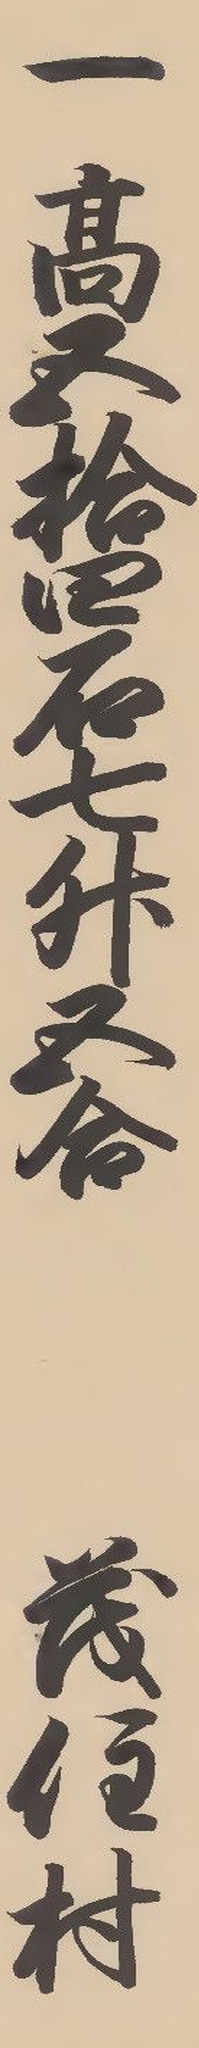一高五拾四石七升五合茂住村
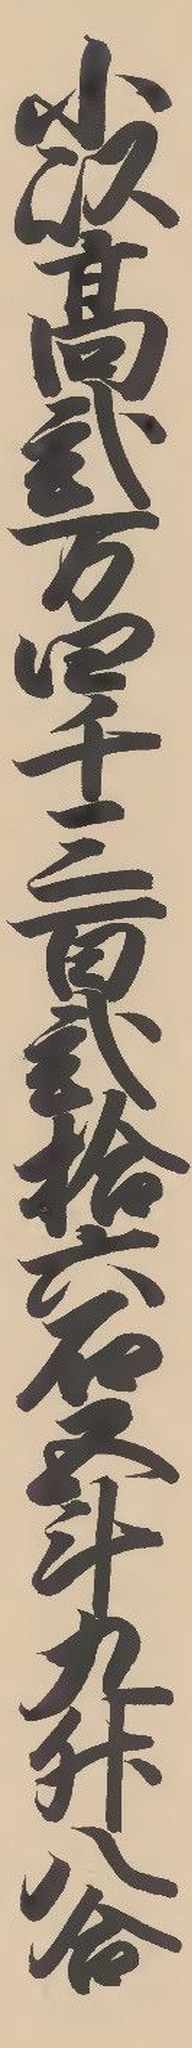小以高弐万四千三百弐拾六石五斗九升八合
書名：飛騨国郷帳
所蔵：国立公文書館 National Archives of Japan
